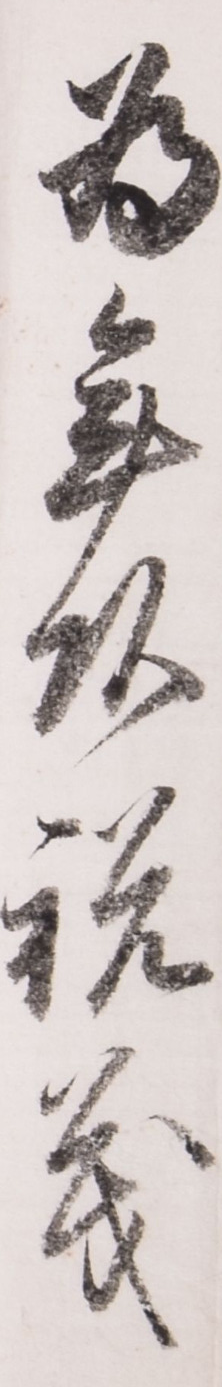為年頭祝義
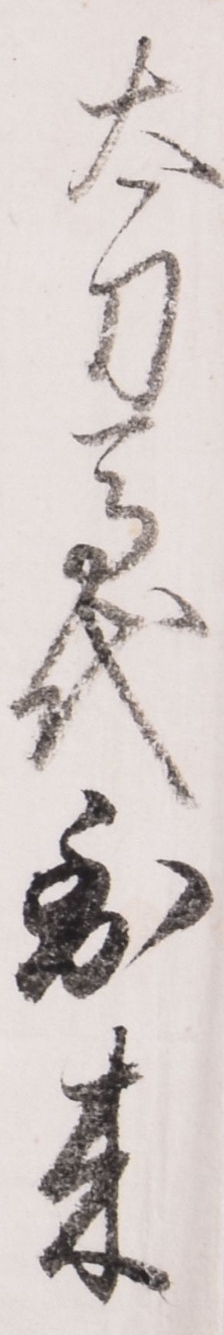太刀馬代到来
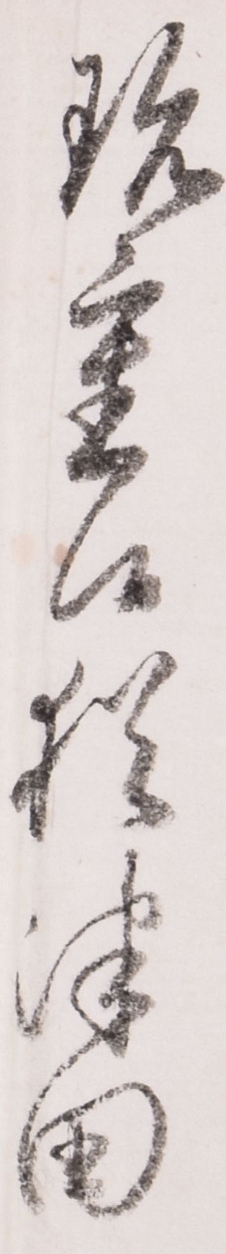珍重候猶津田
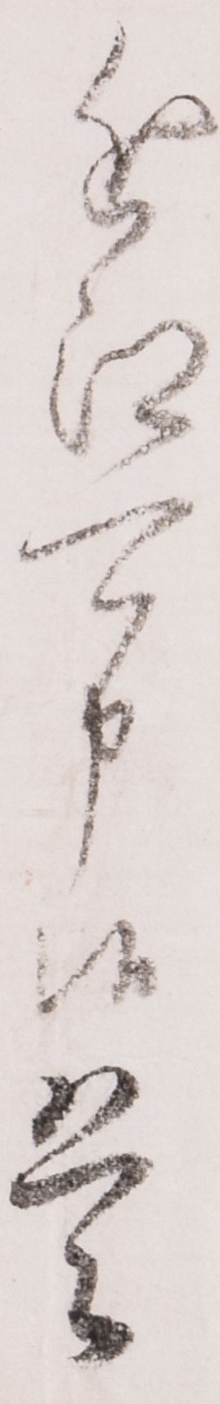近江可申候恐々
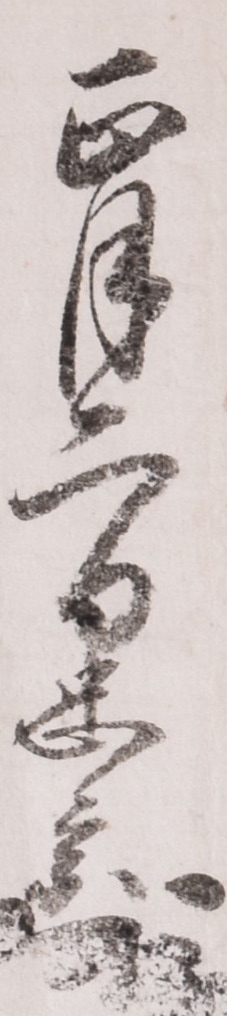正月二日忠宗
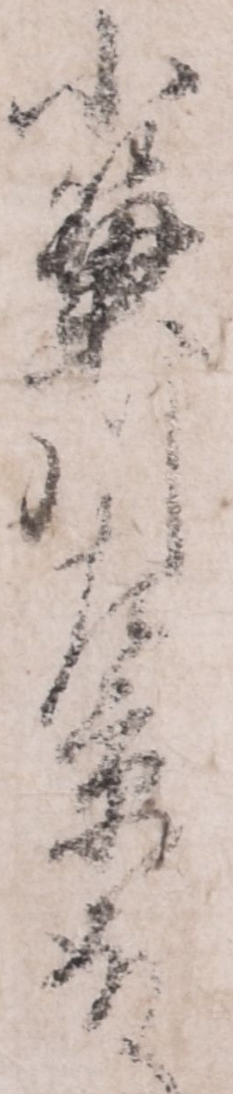小梁川左京殿
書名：（伊達忠宗書状：年賀）（「為年以祝義〜」）
